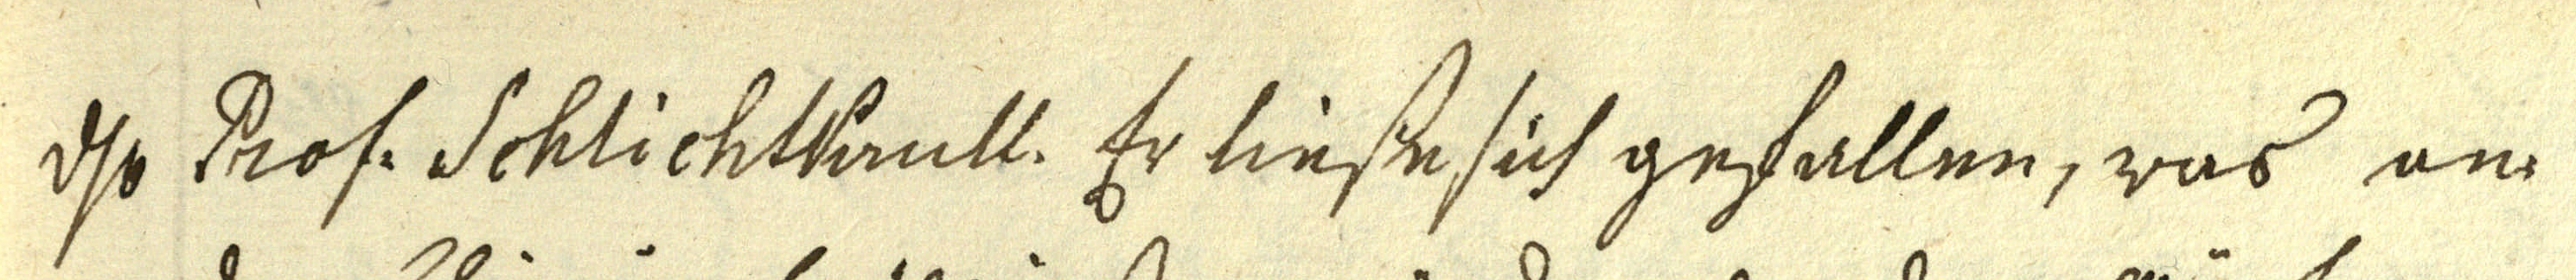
dh Prof. Schlichtkrull. Er ließe sich gefallen, was an¬
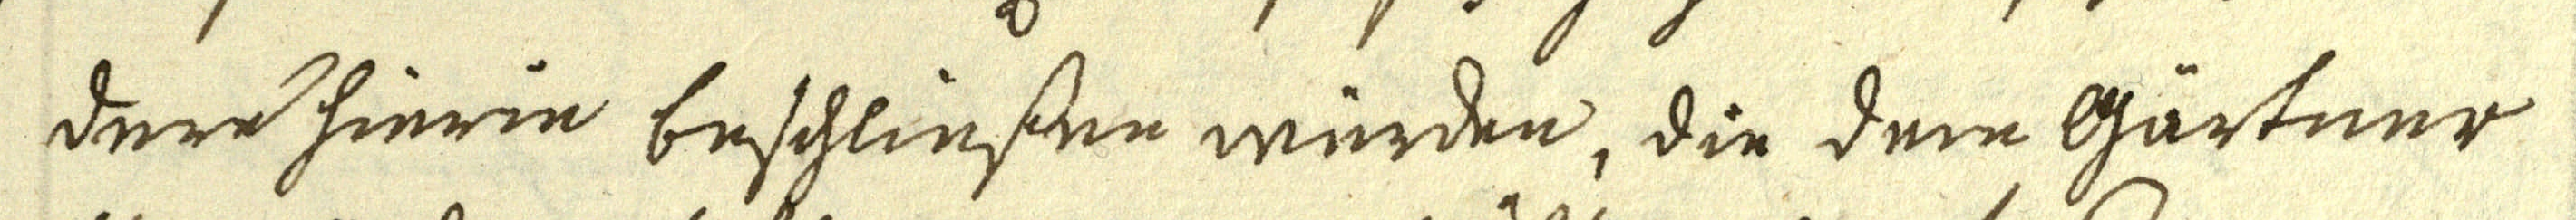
dere hierin beschließen würden, die dem Gärtner
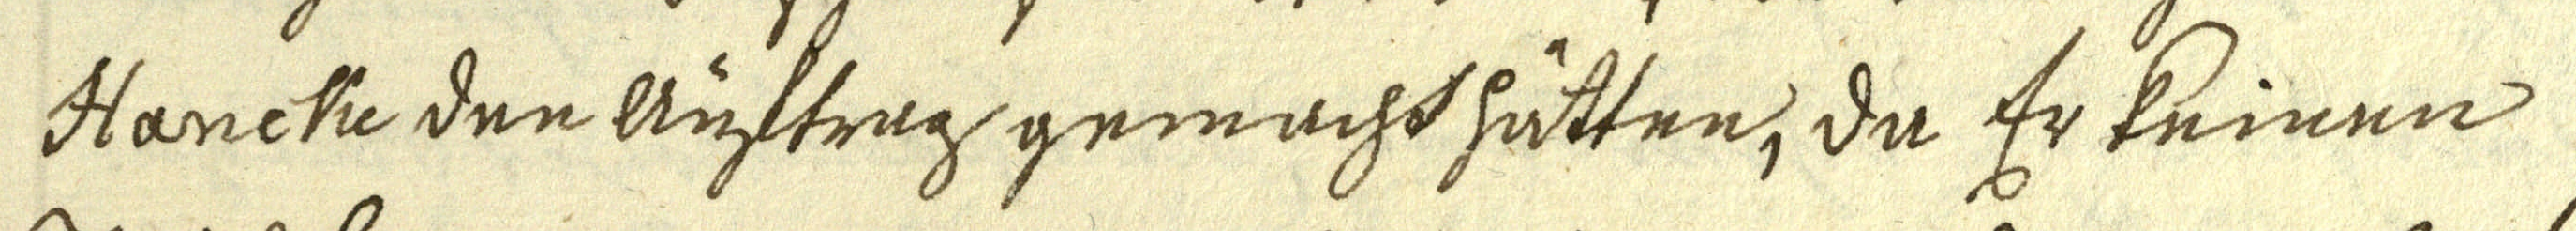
Hancke den Auftrag gemacht hätten, da Er keinen
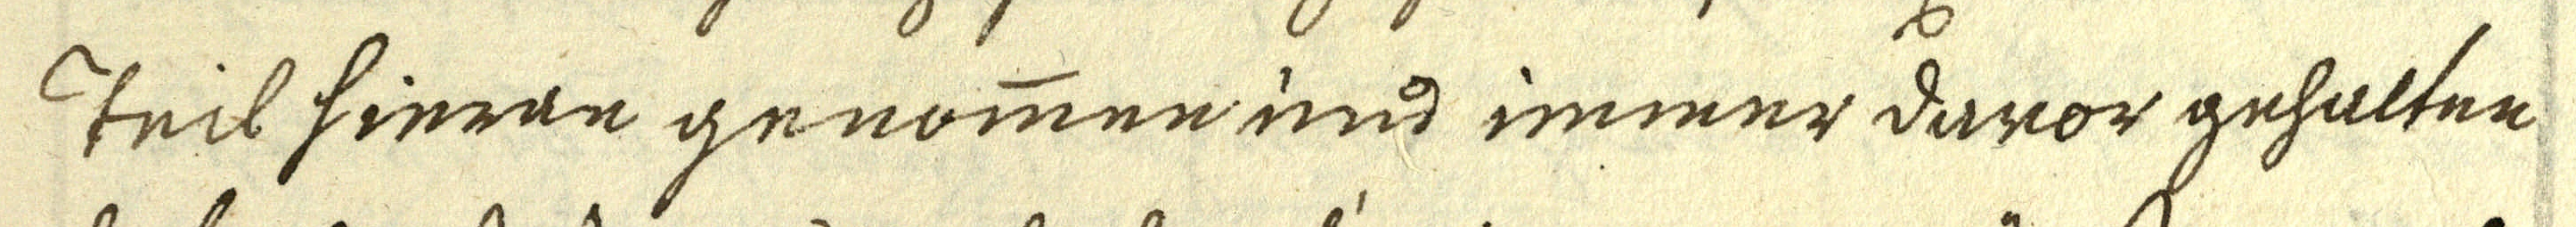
teil hieran genomen und immer davor gehalten
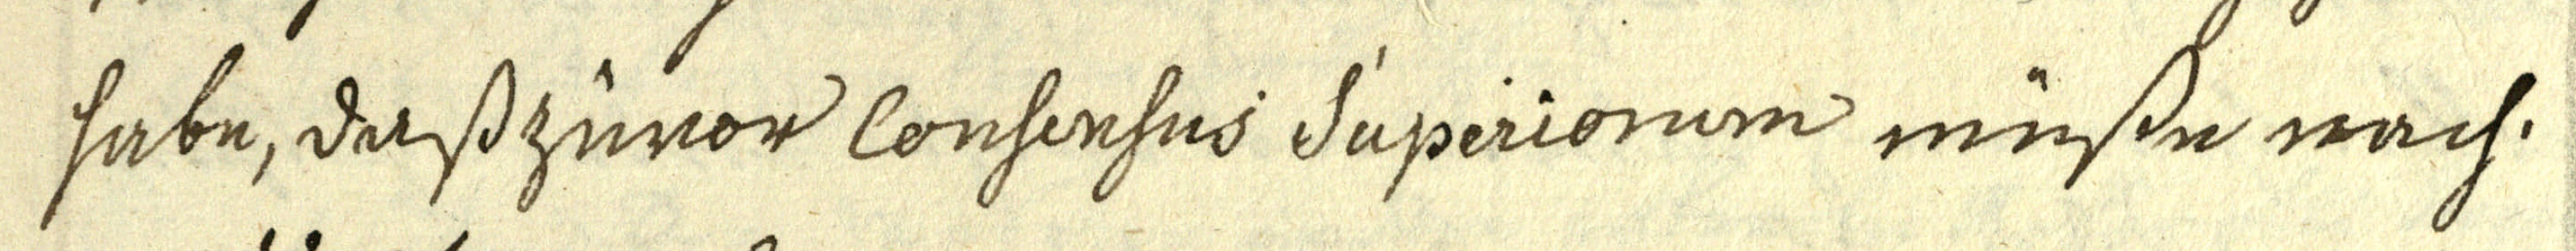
habe, daß zuvor Consensus Superiorum müße nach¬
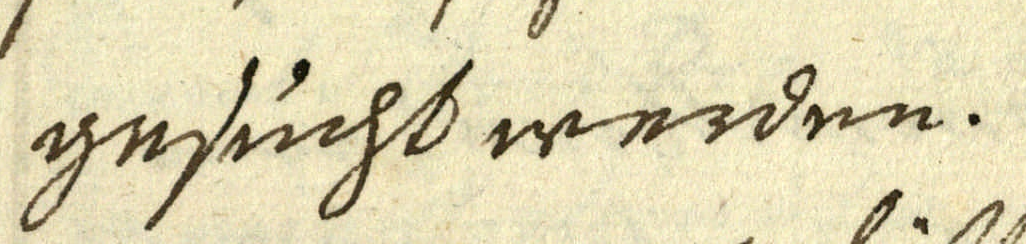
gesucht werden.
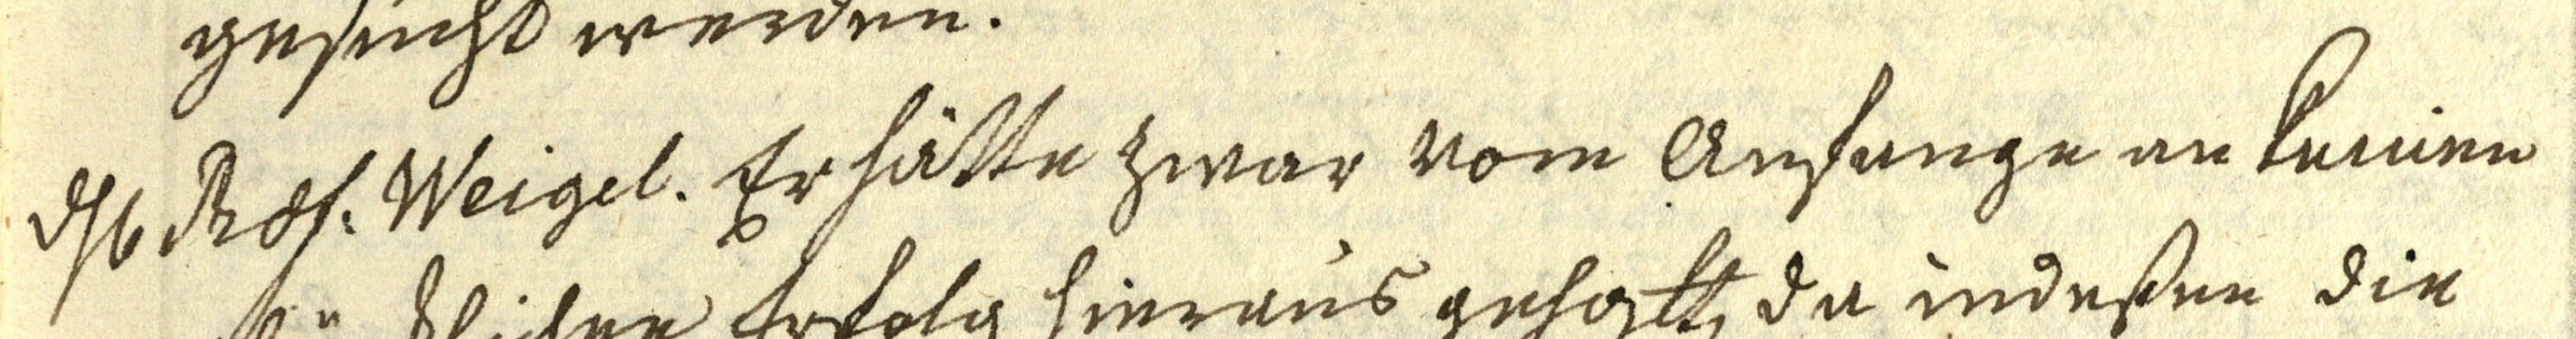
dh Prof. Weigel. Er hätte zwar vom Anfange an keinen
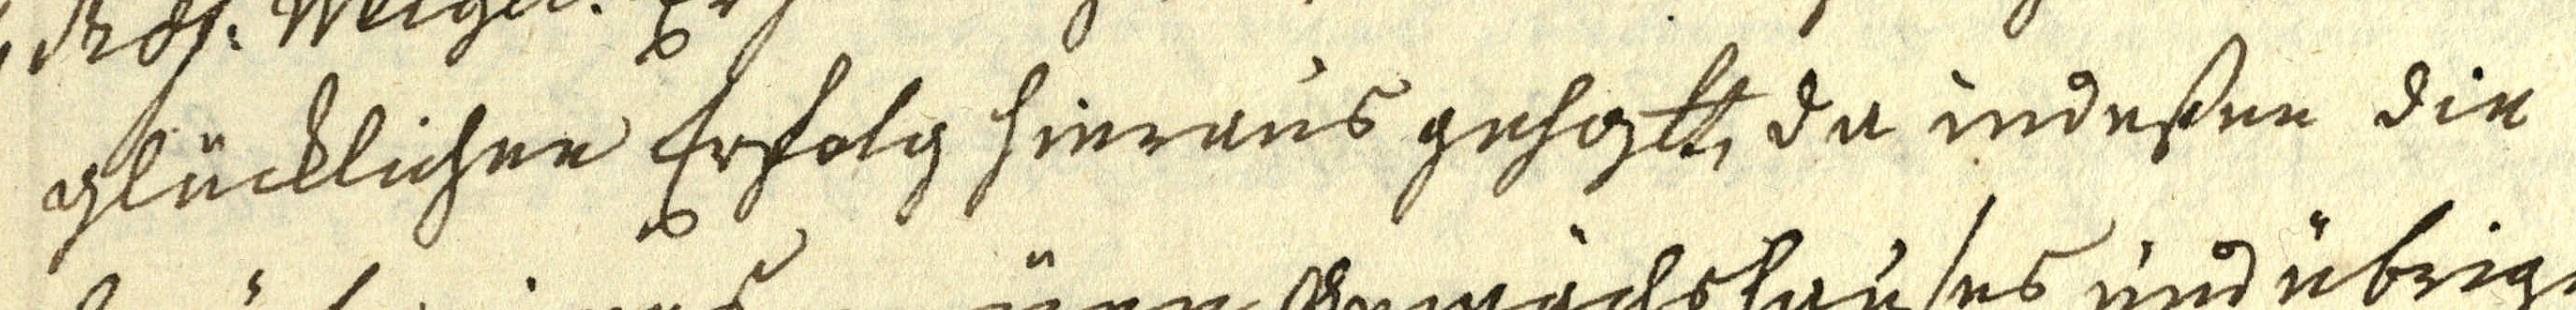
glücklichen Erfolg hieraus gehoft, da indeßen die
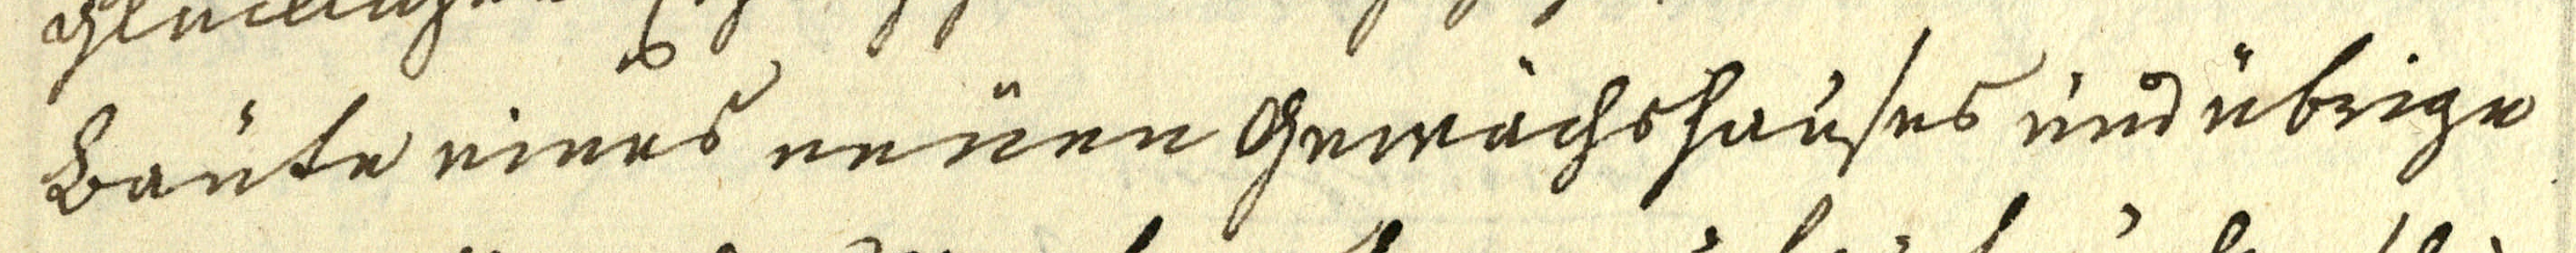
Baute eines neuen Gewächshauses und übrige
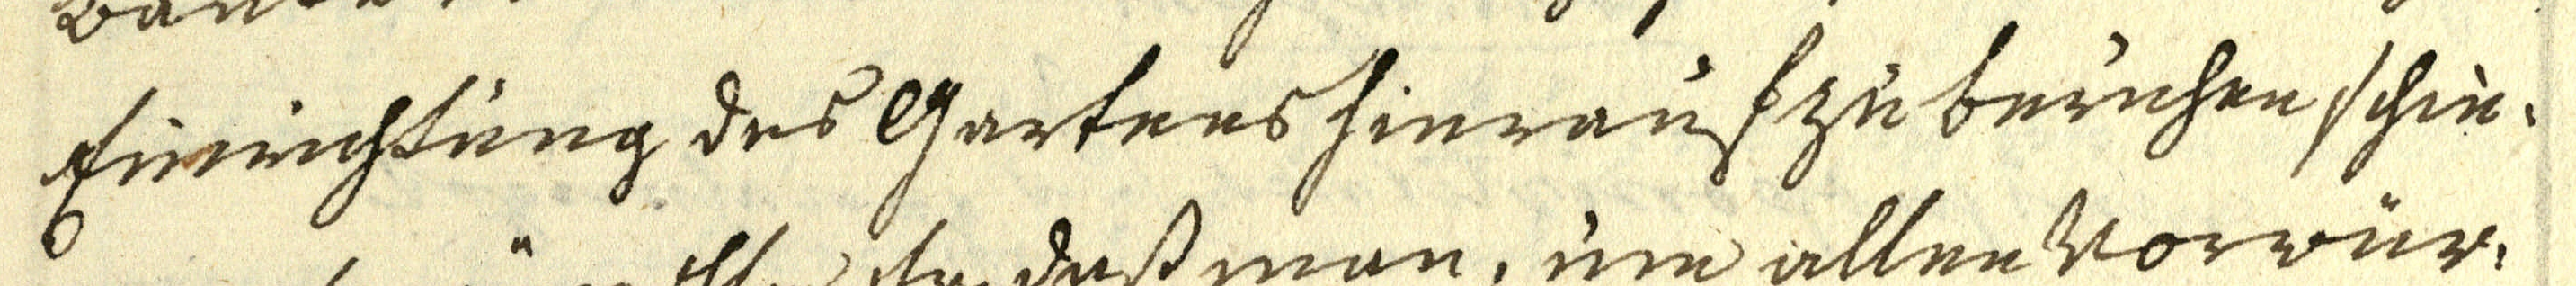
Einrichtung des Gartens hierauf zu beruhen schie¬
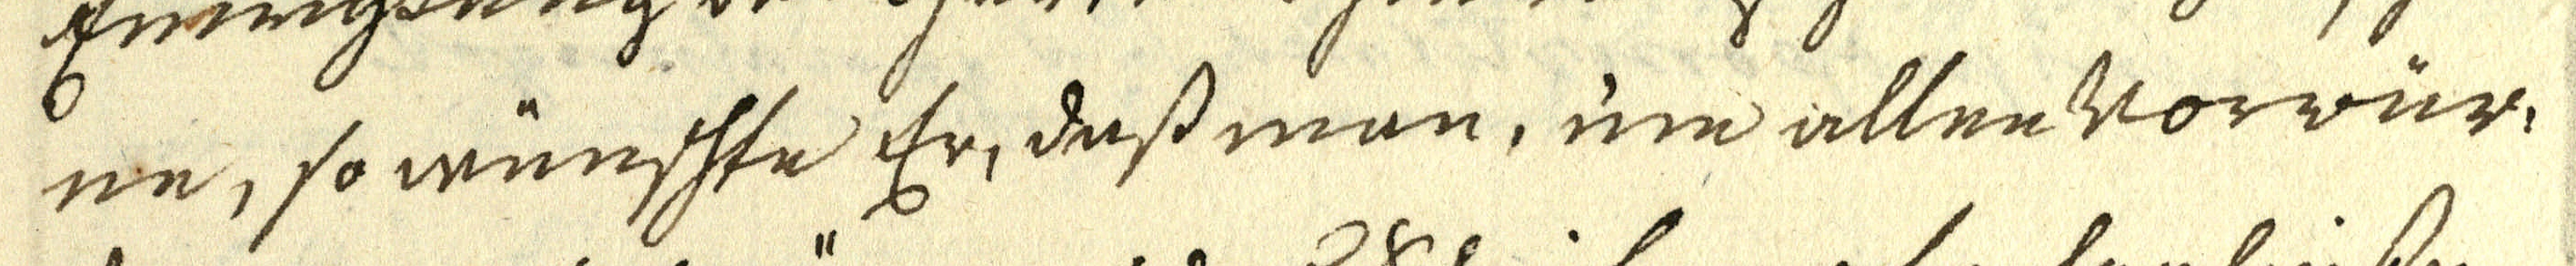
ne, so wünschte Er, daß man, um allen Vorwürf¬
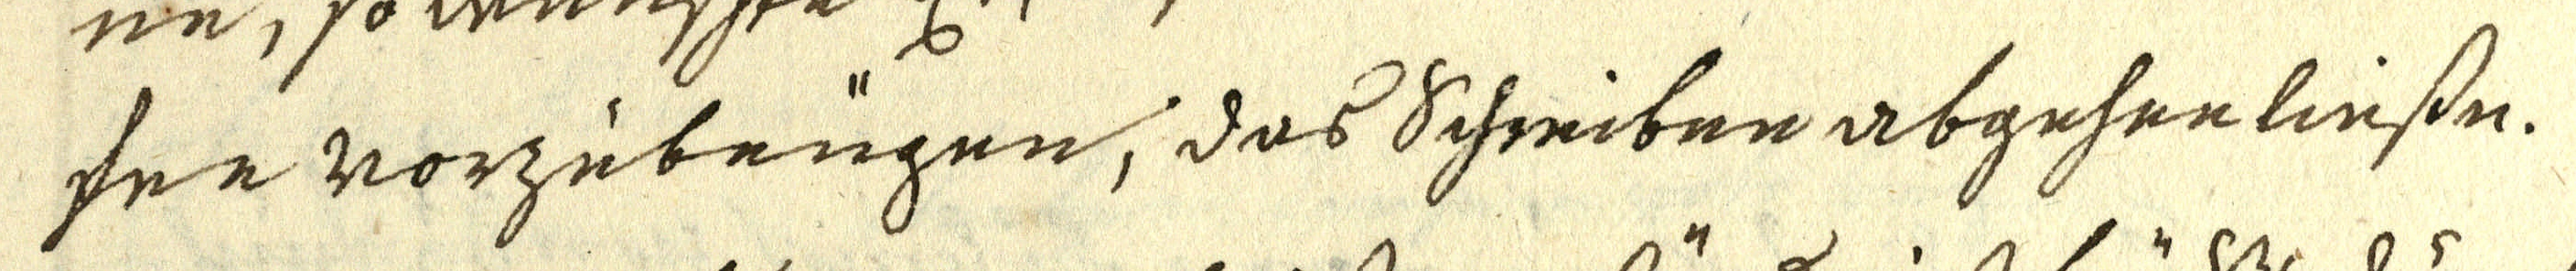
fen vorzubeugen, das Schreiben abgehen ließe.
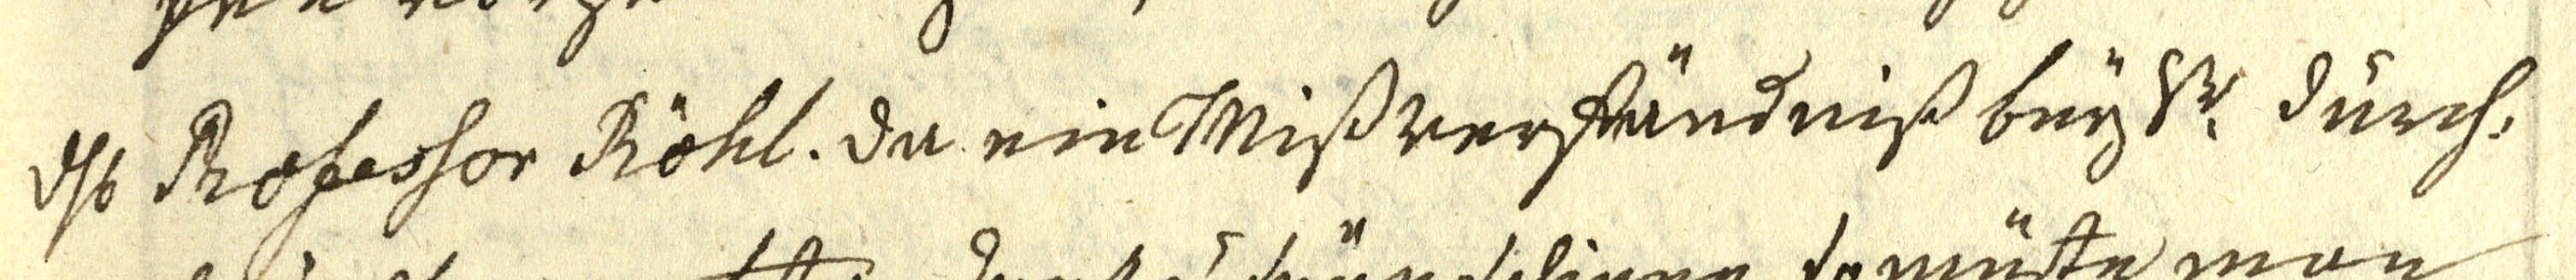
dh Professor Röhl. Da ein Mißverständniß beÿ Sr Durch¬
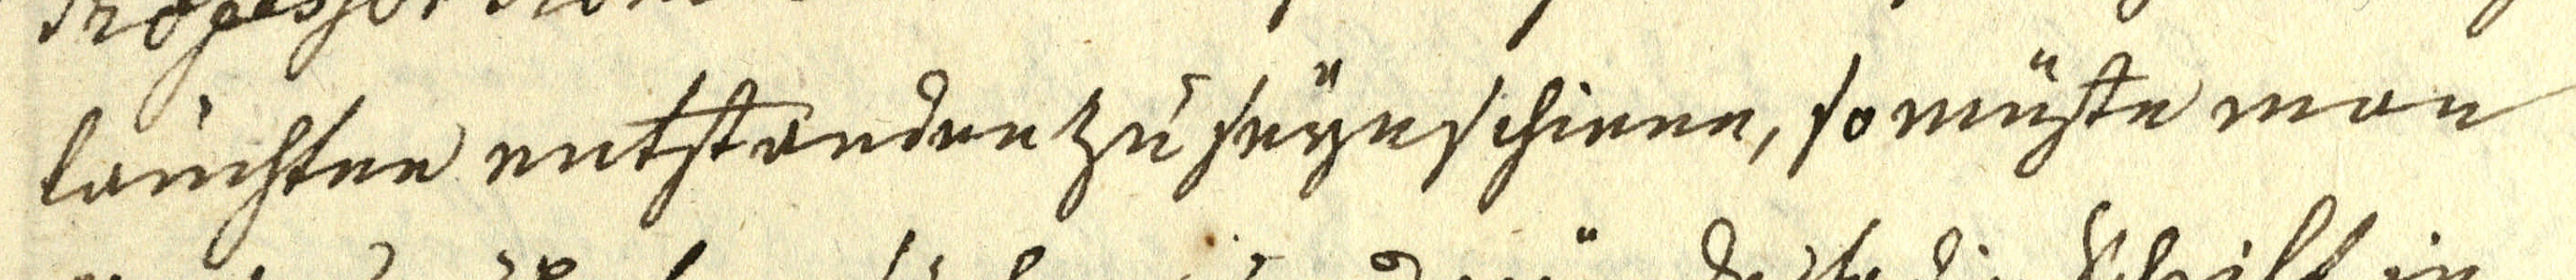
lauchten entstanden zu seÿn schiene, so müste man
